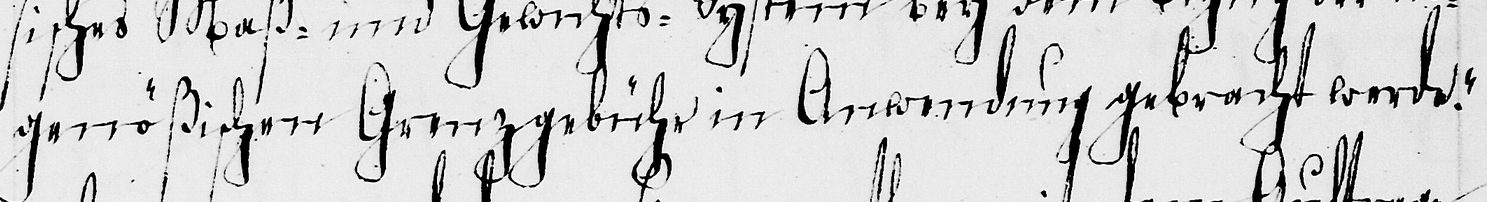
genößischen Grenzgebühr in Anwendung gebracht werde“.
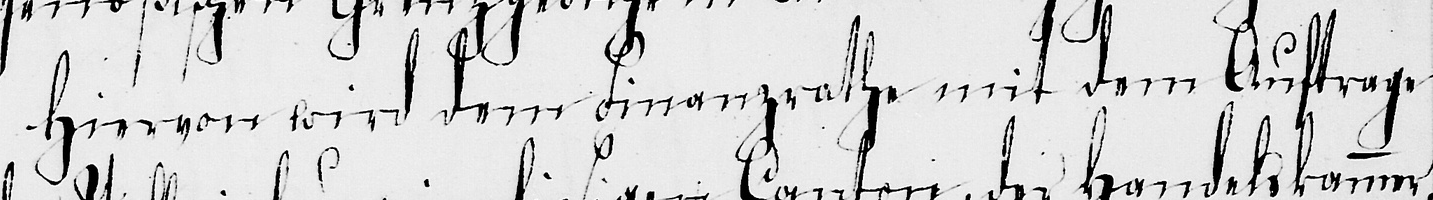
Hiervon wird dem Finanzrathe mit dem Auftrage
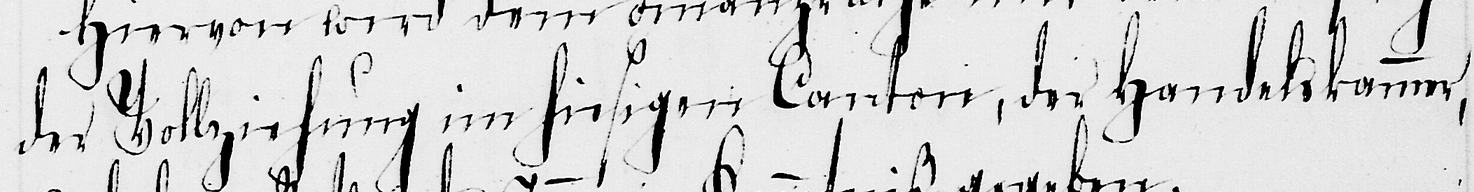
der Vollziehung im hiesigen Canton, der Handelskammer,
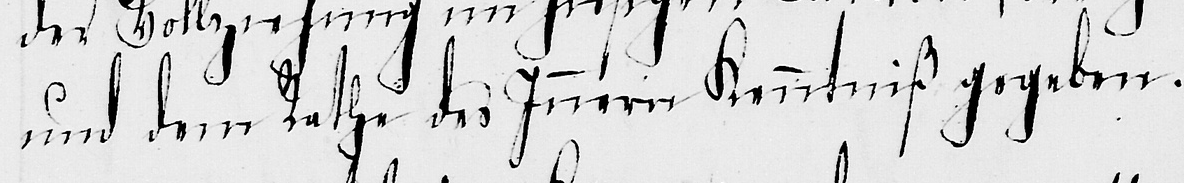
und dem Rathe des Innern Kenntniß gegeben.
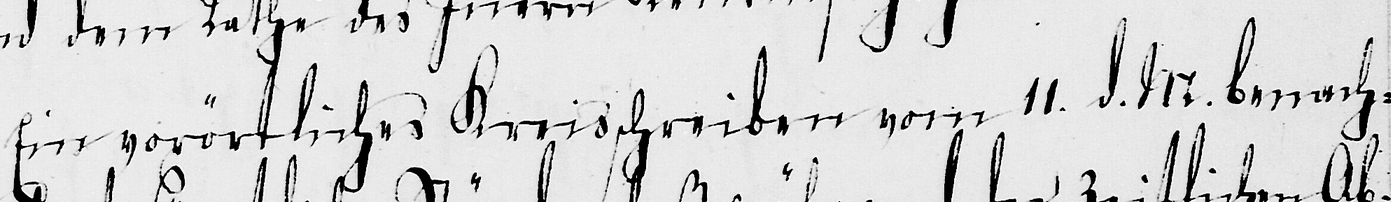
Ein vorörtliches Kreisschreiben vom 11. d. M. benach¬
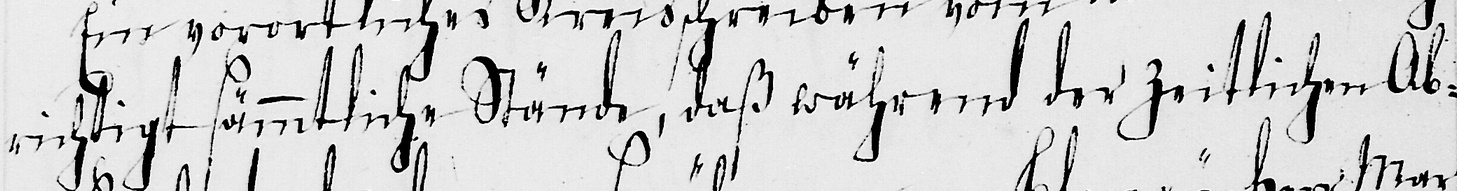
richtigt sämmtliche Stände, daß während der zeitlichen Ab¬
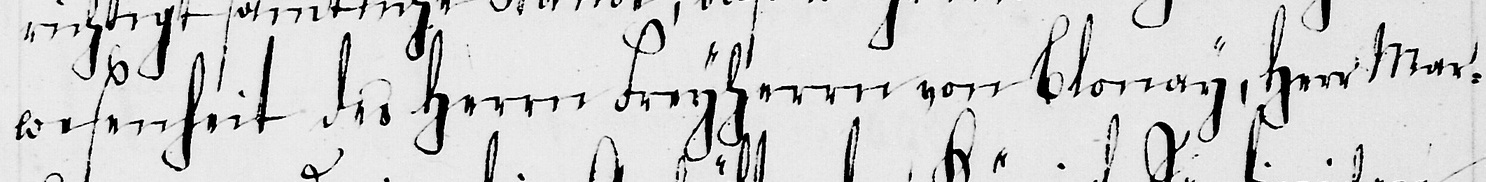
wesenheit des Herrn Freyherrn von Blonay, Herr Mar¬
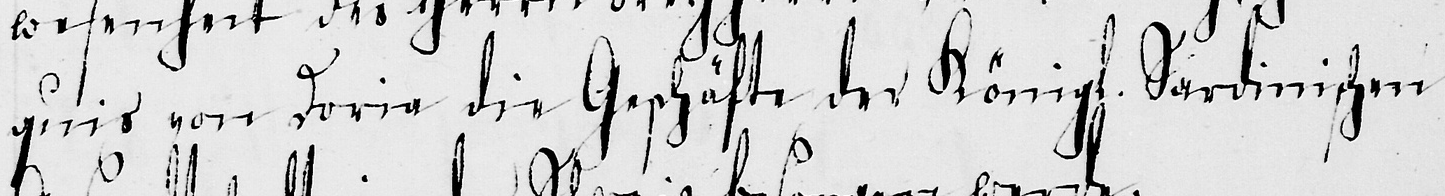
quis von Doria die Geschäfte der Königl. Sardinischen
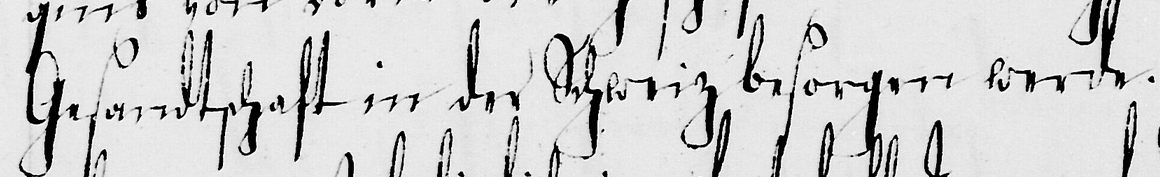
Gesandtschaft in der Schweiz besorgen werde.
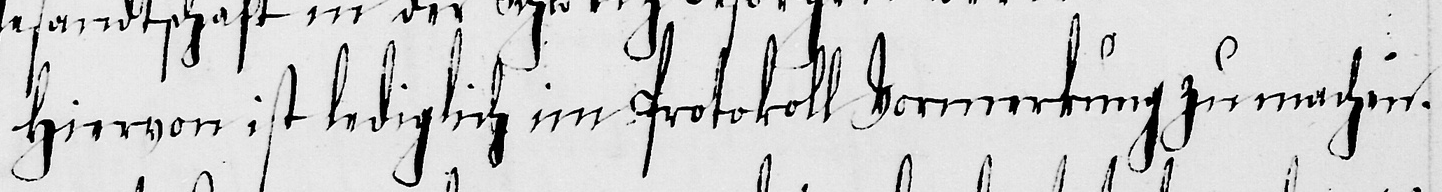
Hiervon ist lediglich im Protokoll Vormerkung zu machen.
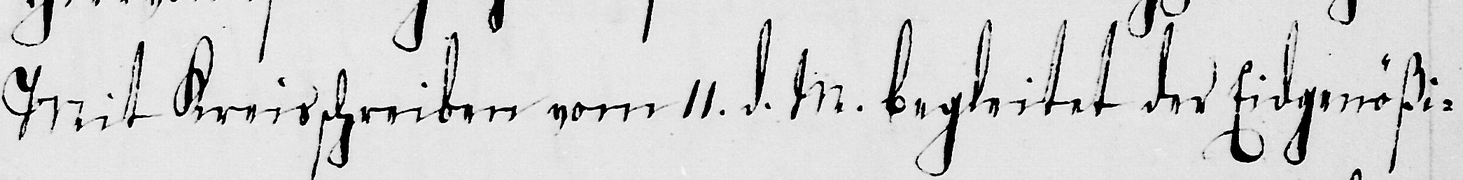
Mit Kreisschreiben vom 11. d. M. begleitet der Eidgenößi-
